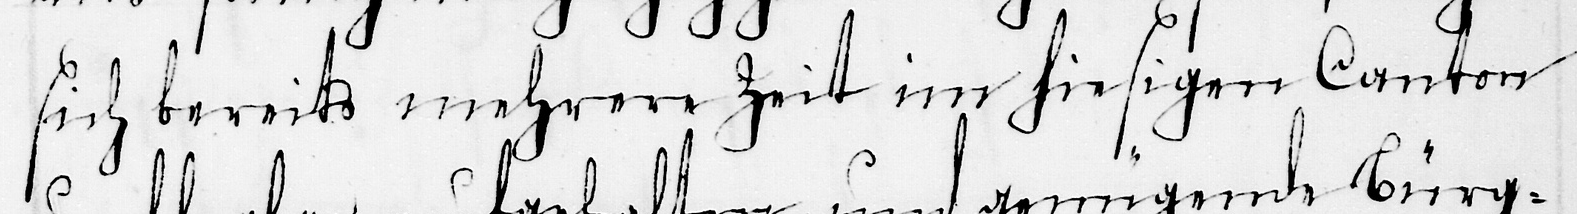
sich bereits mehrere Zeit im hiesigen Canton
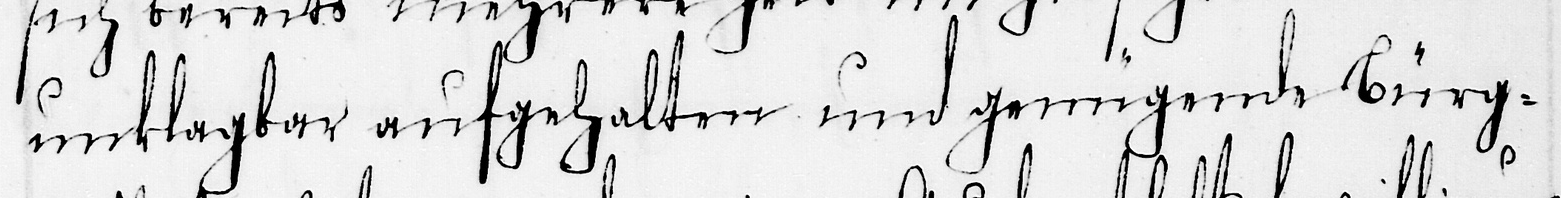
unklagbar aufgehalten und genügende Bürg¬
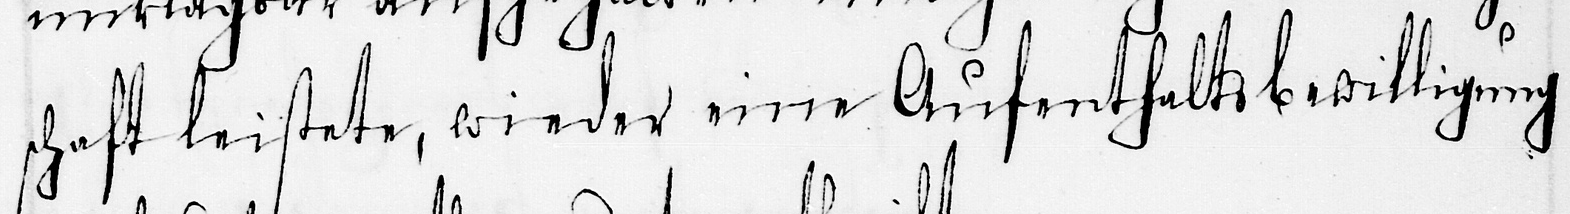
schaft leistete, wieder eine Aufenthaltsbewilligung
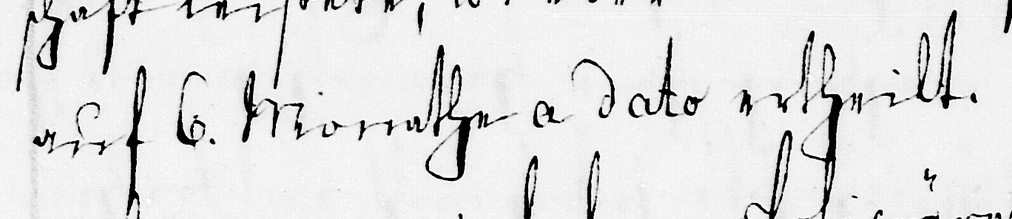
auf 6. Monathe a dato ertheilt.
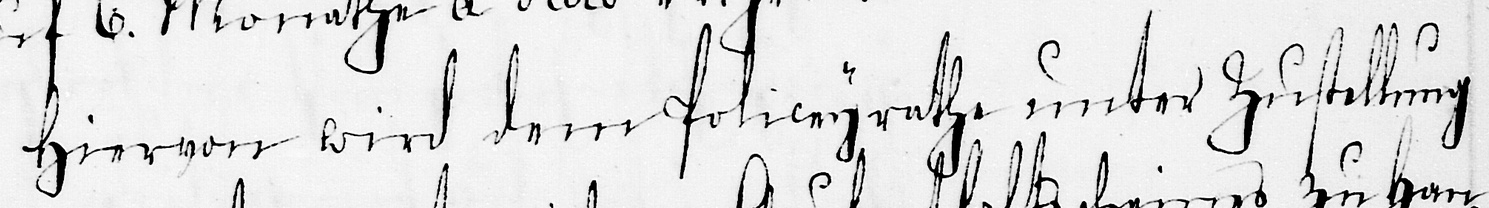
Hiervon wird dem Policeyrathe unter Zustellung
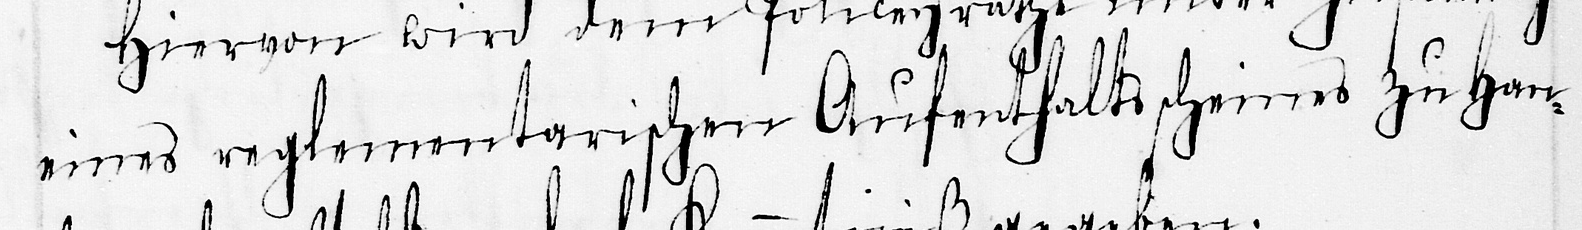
eines reglementarischen Aufenthaltsscheines zu Han¬
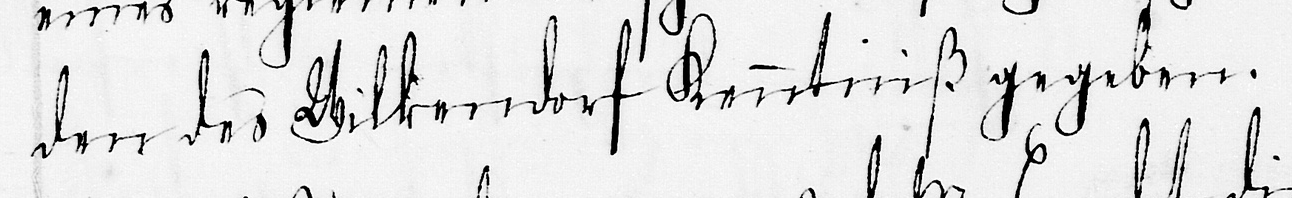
den des Wilkendorf Kenntniß gegeben.
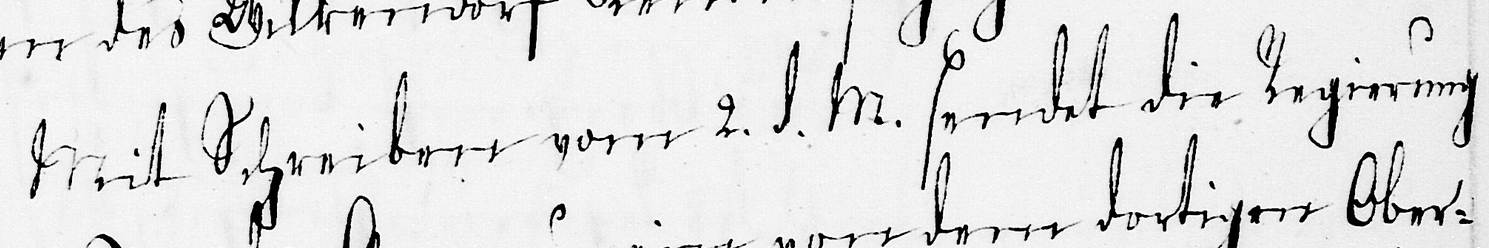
Mit Schreiben vom 2. d. M. sendet die Regierung
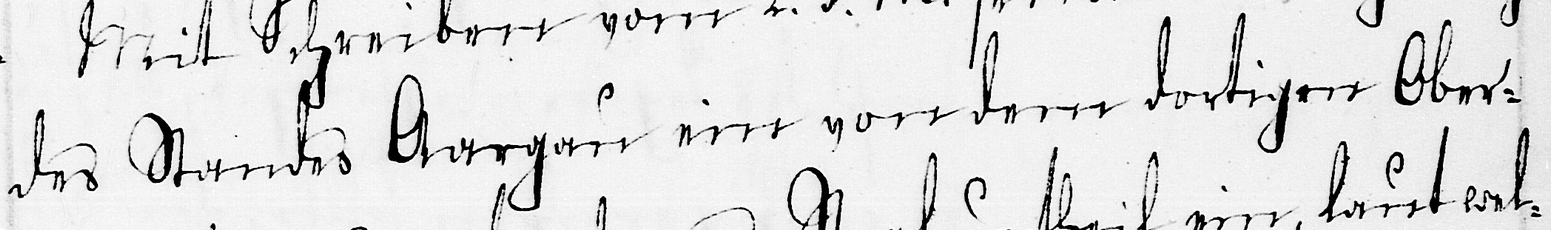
des Standes Aargau ein von dem dortigen Ober¬
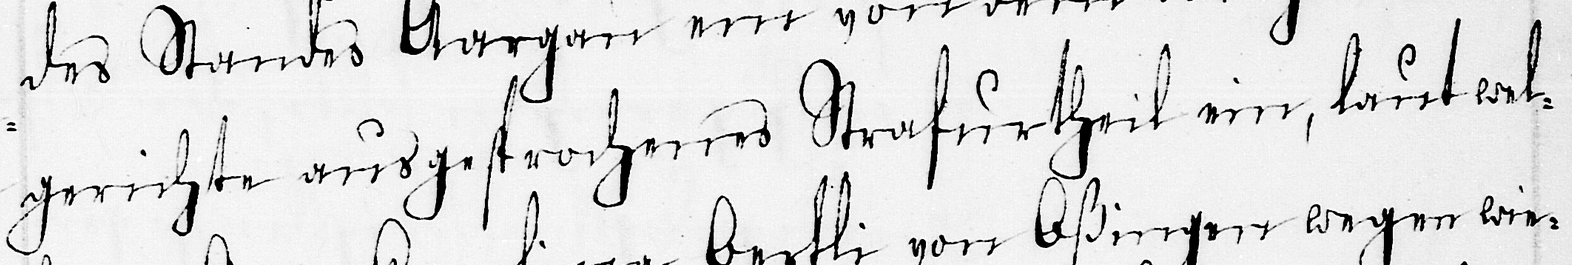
gerichte ausgesprochenes Strafurtheil ein, laut wel¬
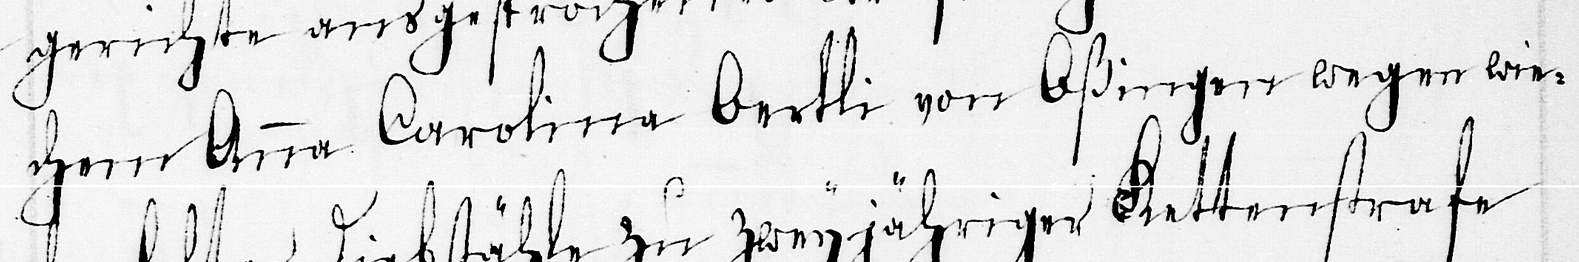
chem Anna Carolina Oertli von Oßingen wegen wie¬
